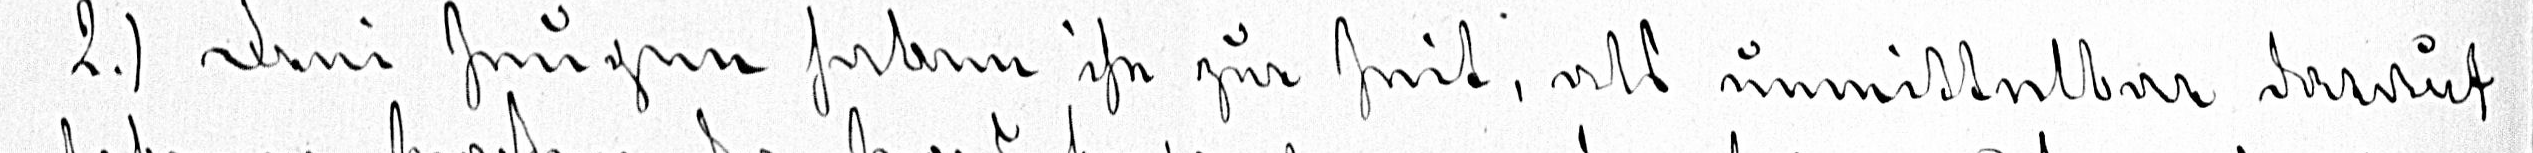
2.) Drei Zeugen haben ihn zur Zeit, als unmittelbar darauf
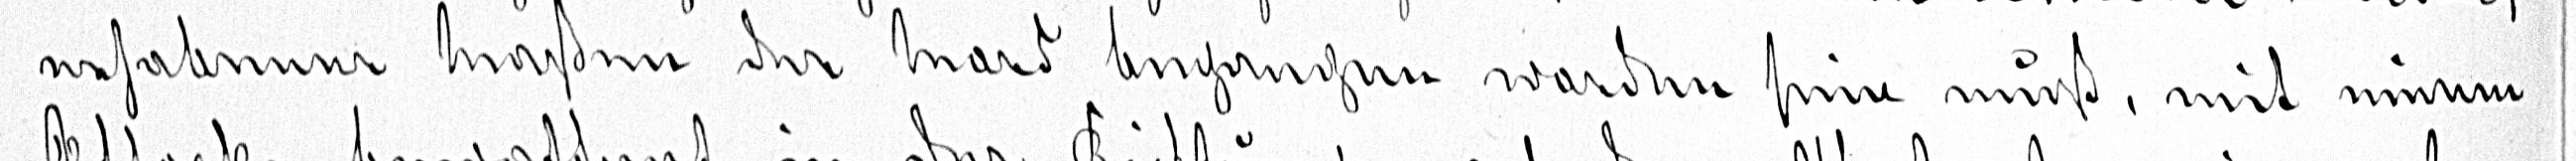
erhobener Maßen der Mord begangen worden seinmuß, mit einem
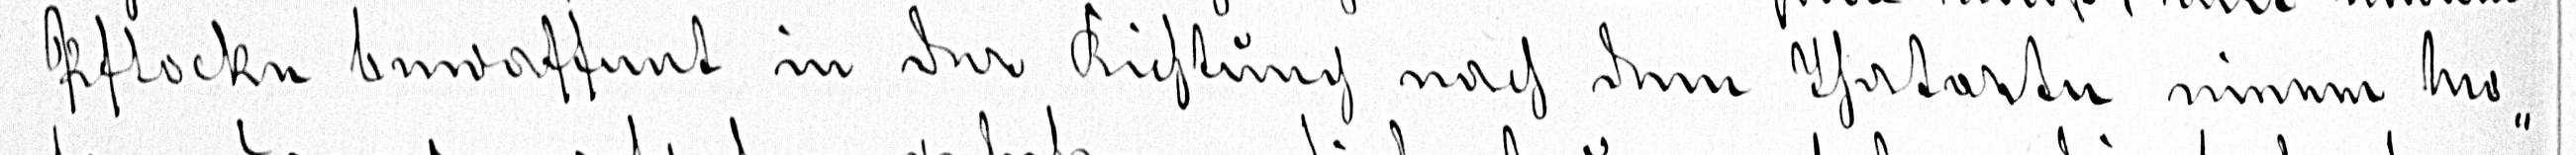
Pflocke bewaffnet in der Richtung nach dem Thatorte einem Mo¬
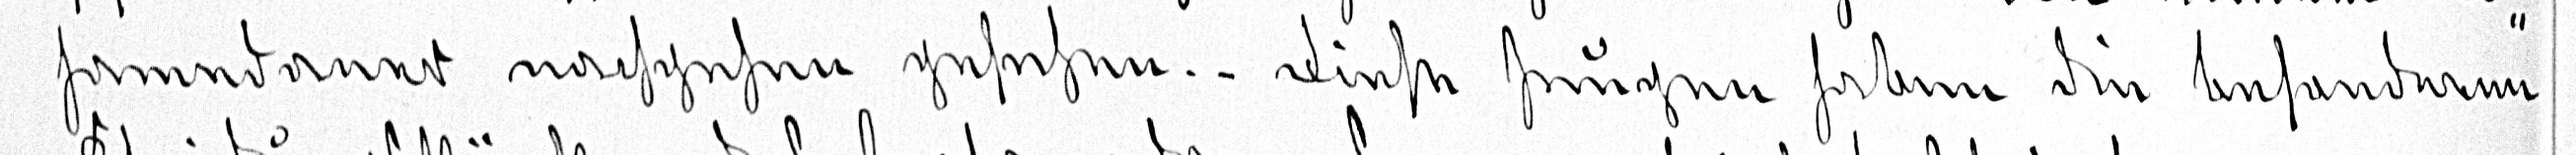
hamedaner nachgehen gesehen.- Diese Zeugen haben die besonderen
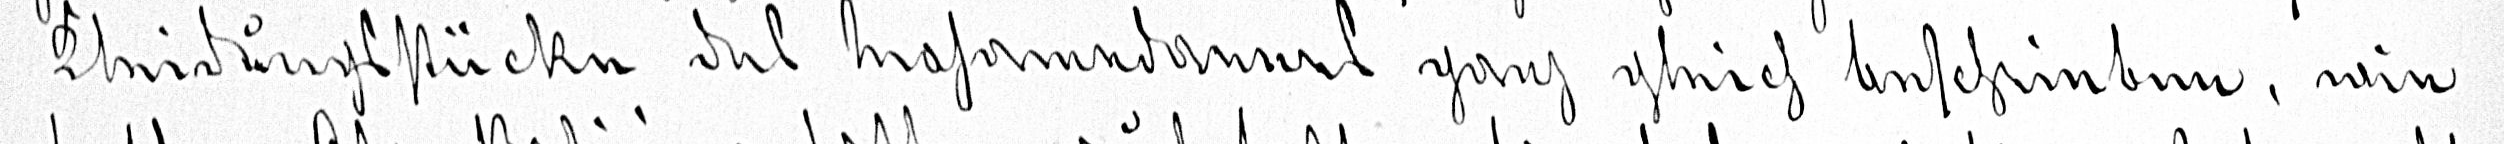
Kleidungsstücke des Mohamedaners ganz gleich beschrieben, wie
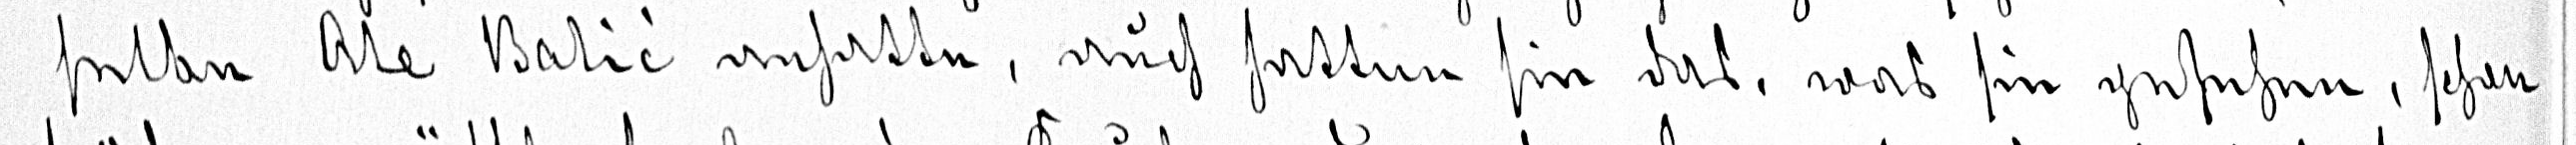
selbe Ale Balić anhatte, auch hatten sie das, was sie gesehen, schon
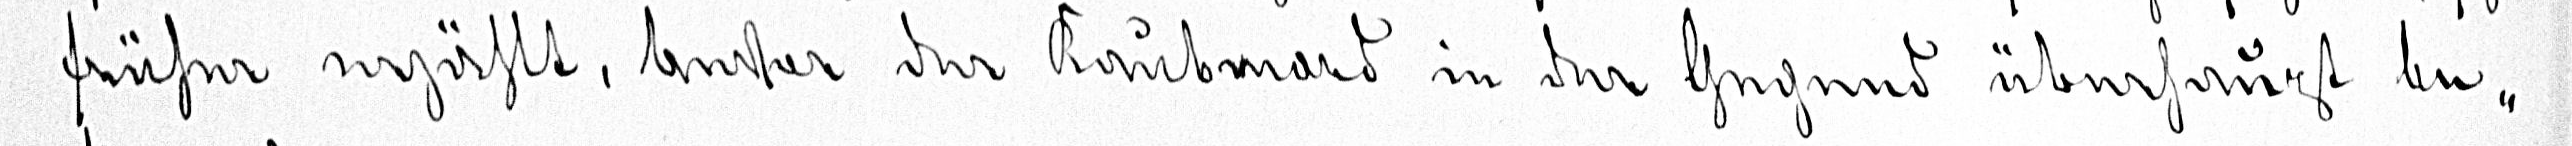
früher erzählt, bevor der Raubmord in der Gegend überhaupt be¬
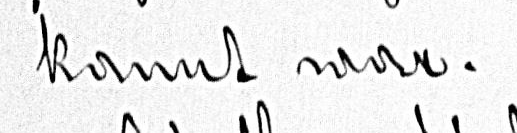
kannt war.
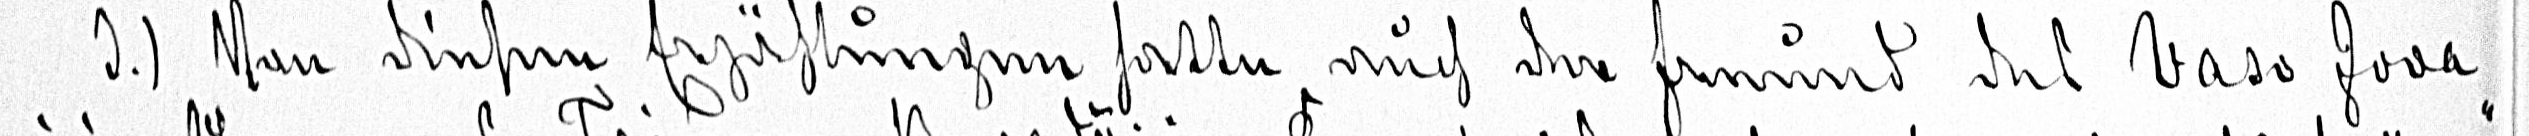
3.) Von diesen Erzählungen hatte auch der Freund des Vaso Jova¬
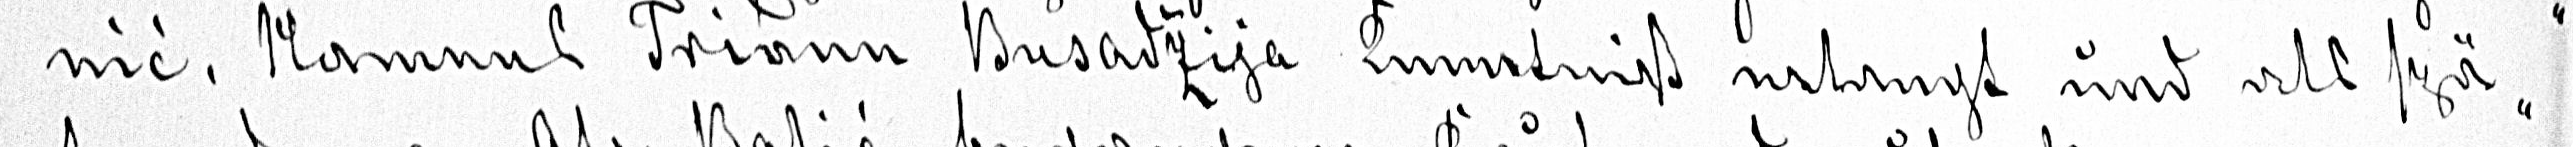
nić.Namens Trionn Busadžija Kenntniß erlangt und als spä¬
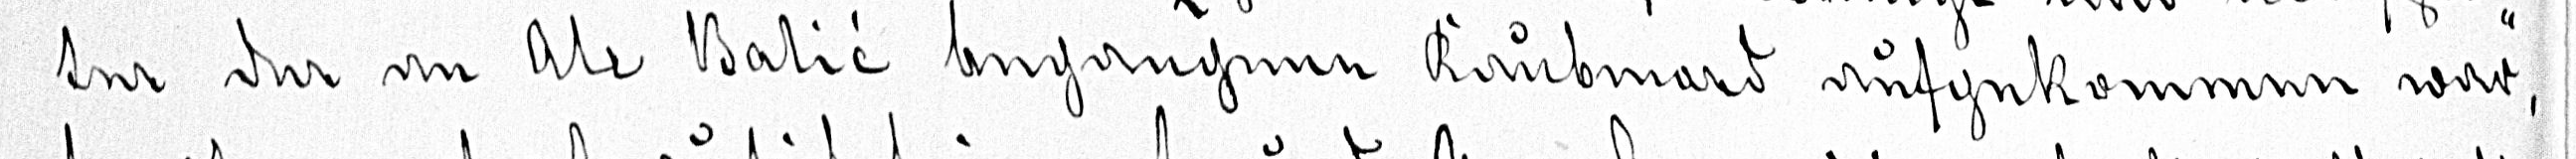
ter der an Ale Balićbegangene Raubmord aufgekommen war,
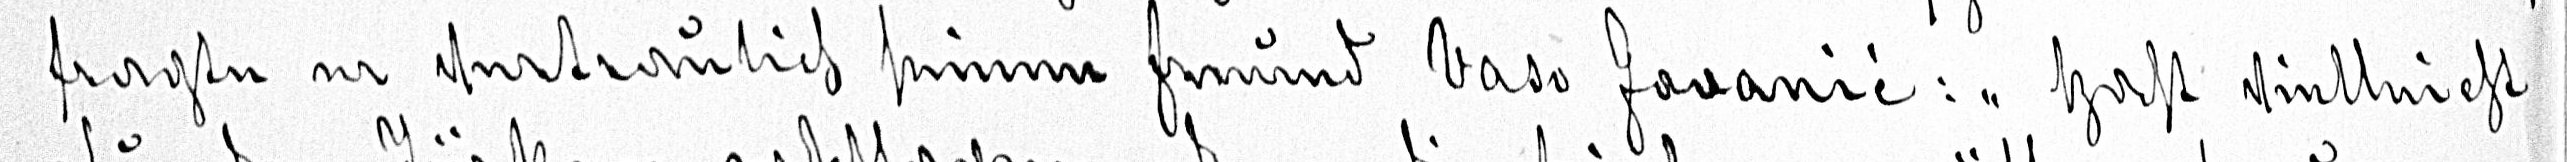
fragte er vertraulich seinen Freund Vaso Jovanić: „Hast vielleicht
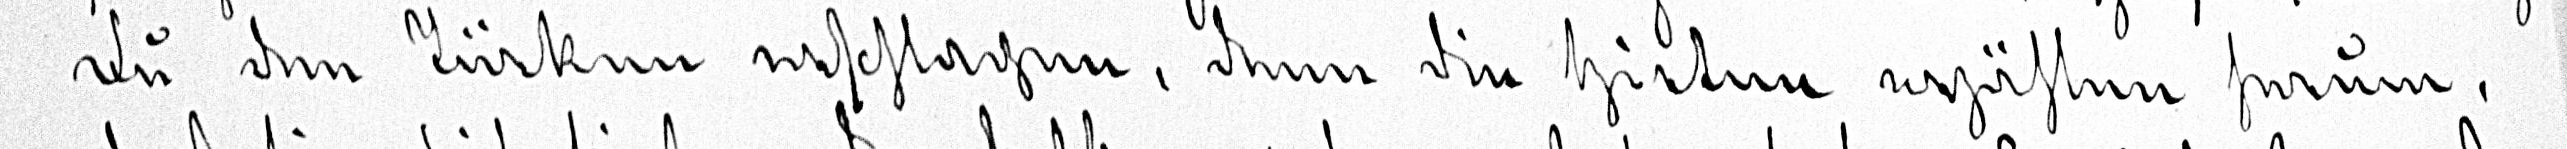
du den Türken erschlagen, denn die Hirten erzählen herum,
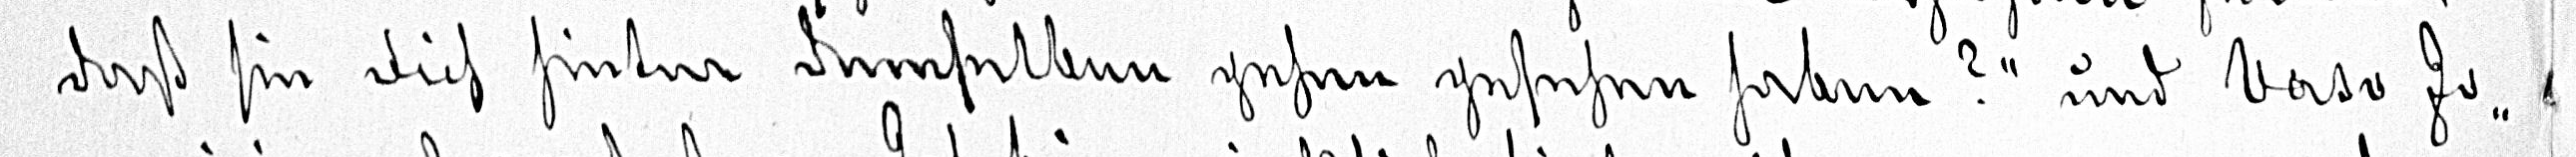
daß sie dich hinter demselben gehen gesehen haben?“ und Vaso Jo¬
